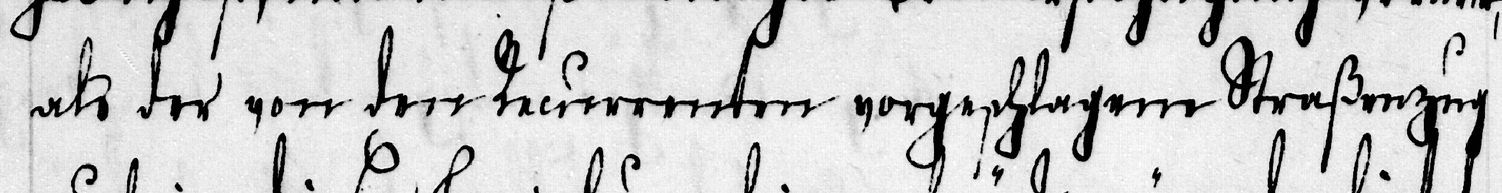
als der von den Recurrenten vorgeschlagene Straßenzug
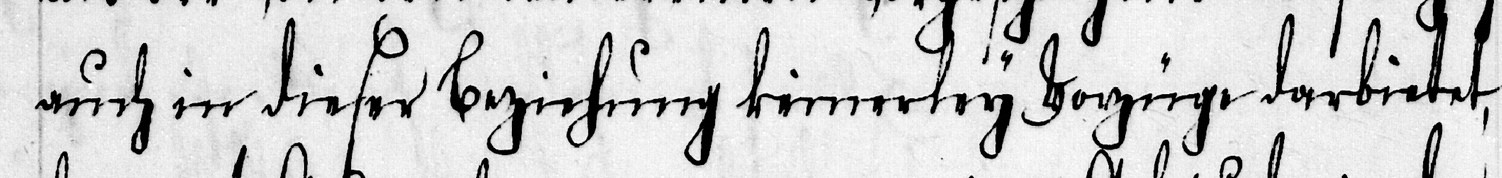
auch in dieser Beziehung keinerley Vorzüge darbietet,
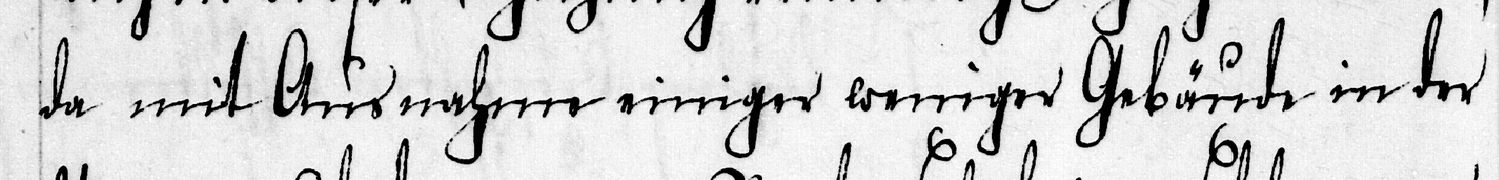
da mit Ausnahme einiger weniger Gebäude in der
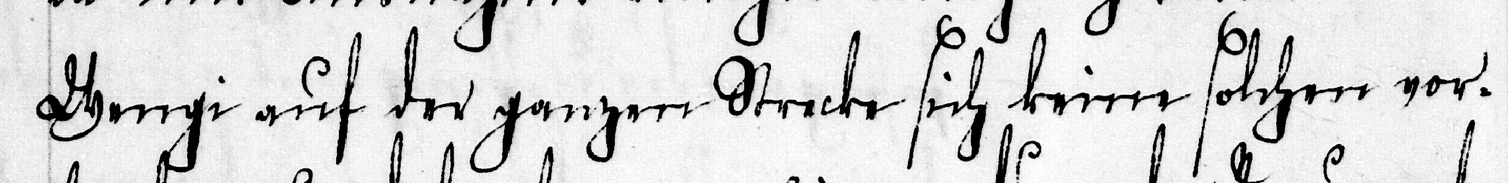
Wengi auf der ganzen Strecke sich keine solchen vor¬
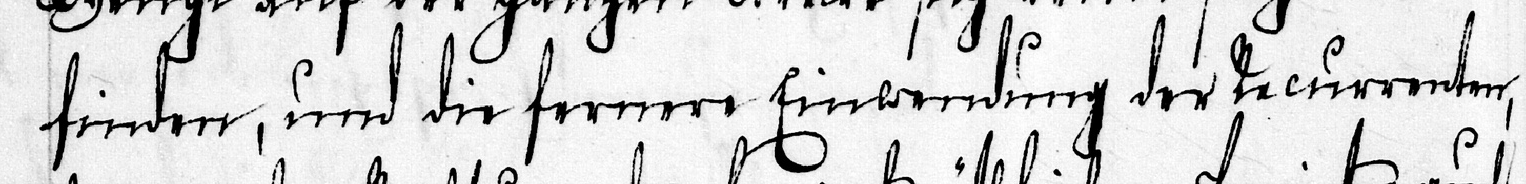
finden, und die fernere Einwendung der Recurrenten,
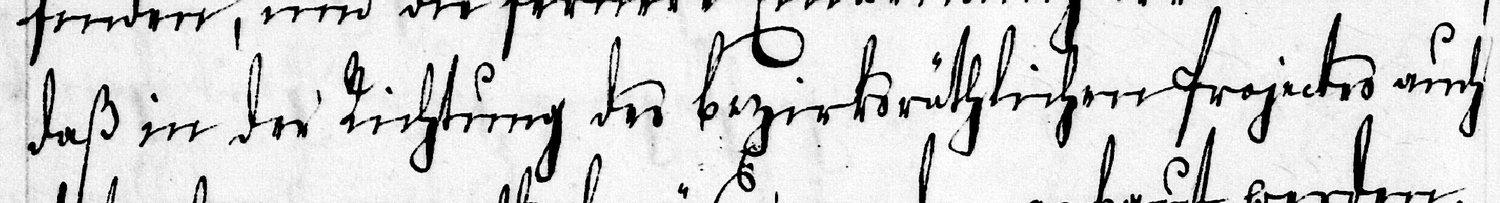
daß in der Richtung des bezirksräthlichen Projectes auch
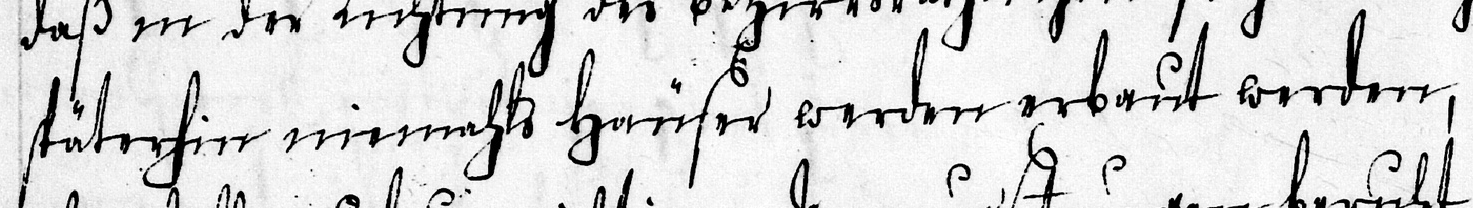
späterhin niemahls Häuser werden erbaut werden,
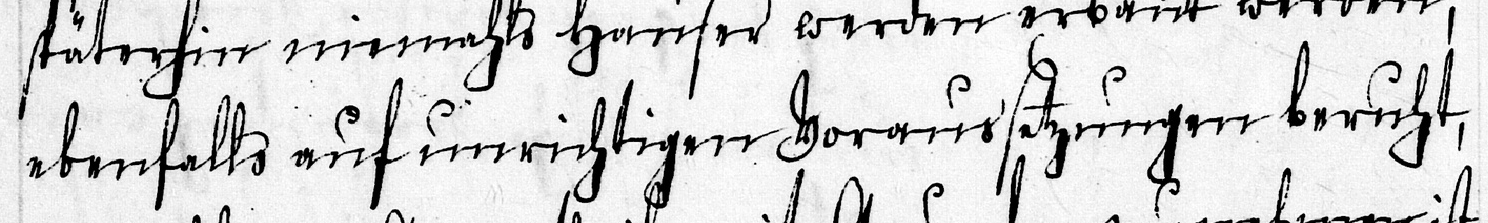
ebenfalls auf unrichtigen Voraussetzungen beruht,
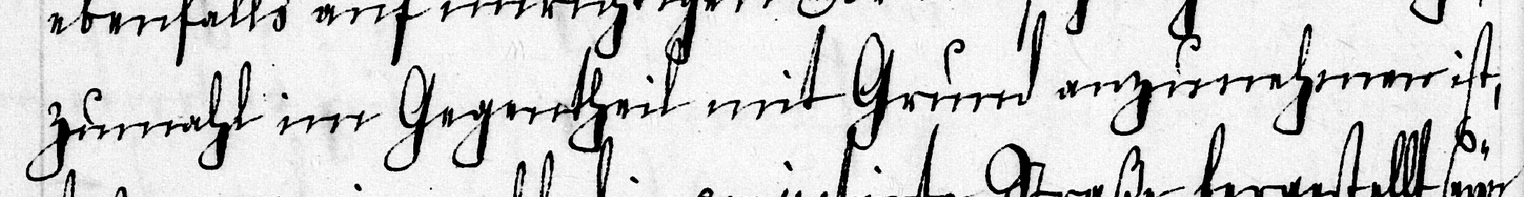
zumahl im Gegentheil mit Grund anzunehmen ist,
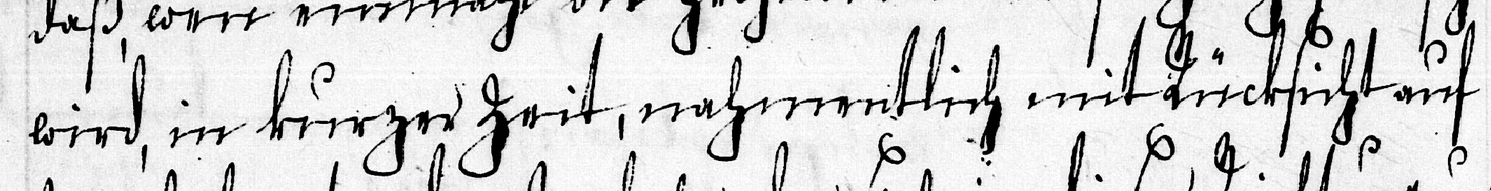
wird, in kurzer Zeit, nahmentlich mit Rücksicht auf
